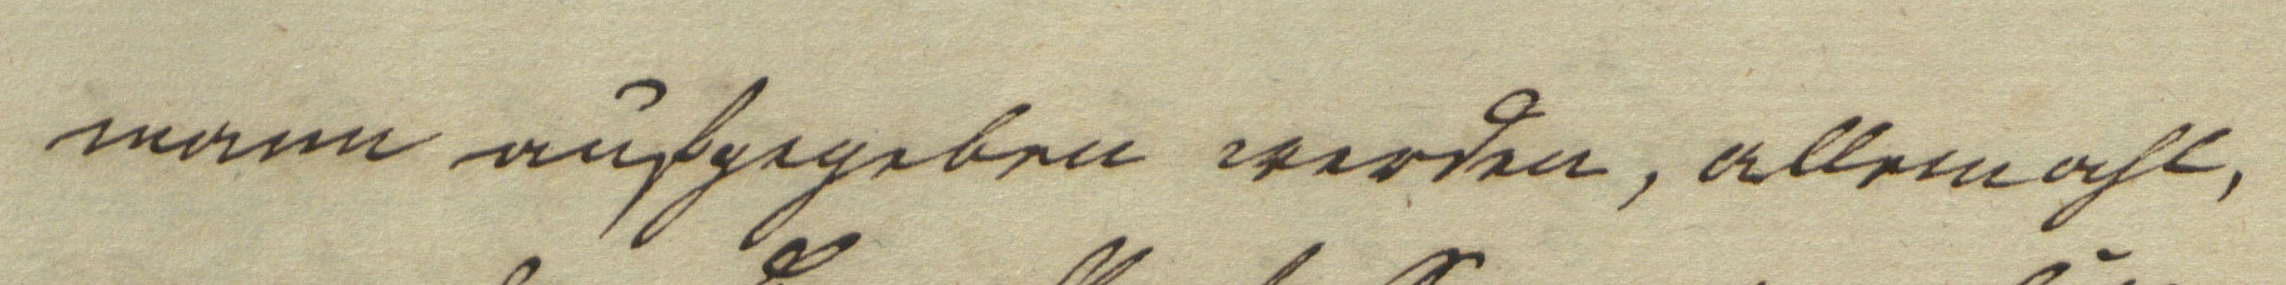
mann aufgegeben werden, allemahl,
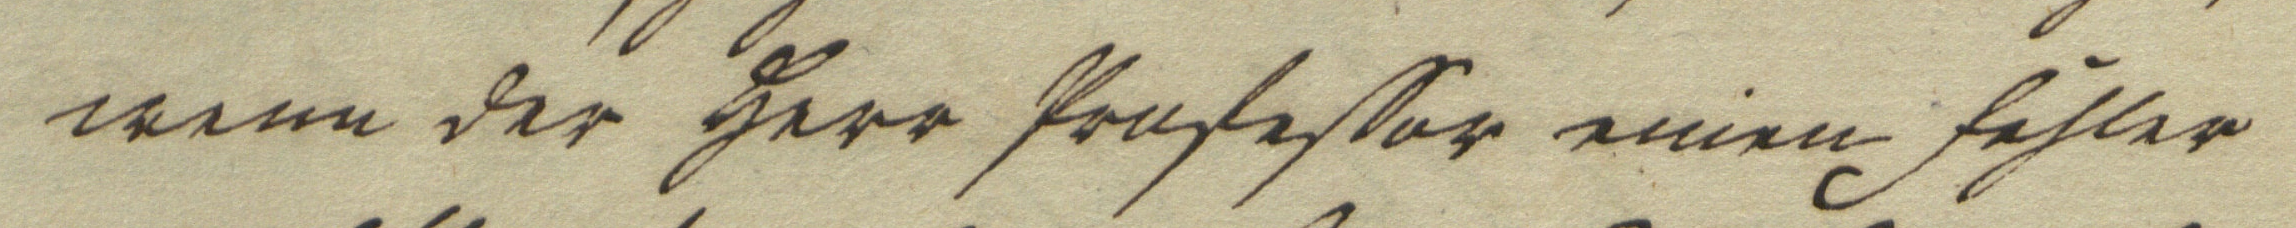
wenn der Herr Professor einen Fehler
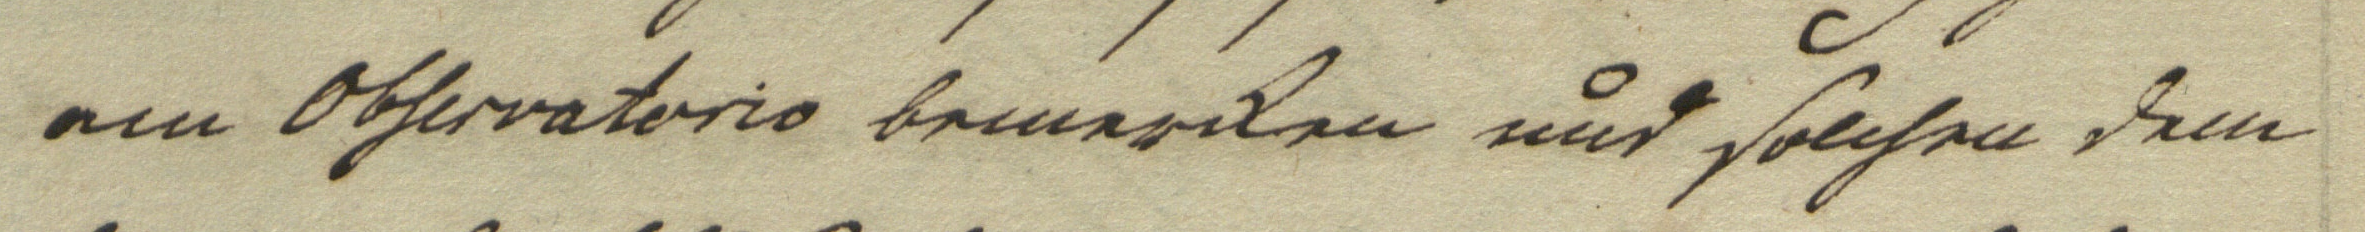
am Observatorio bemercken und solchen dem
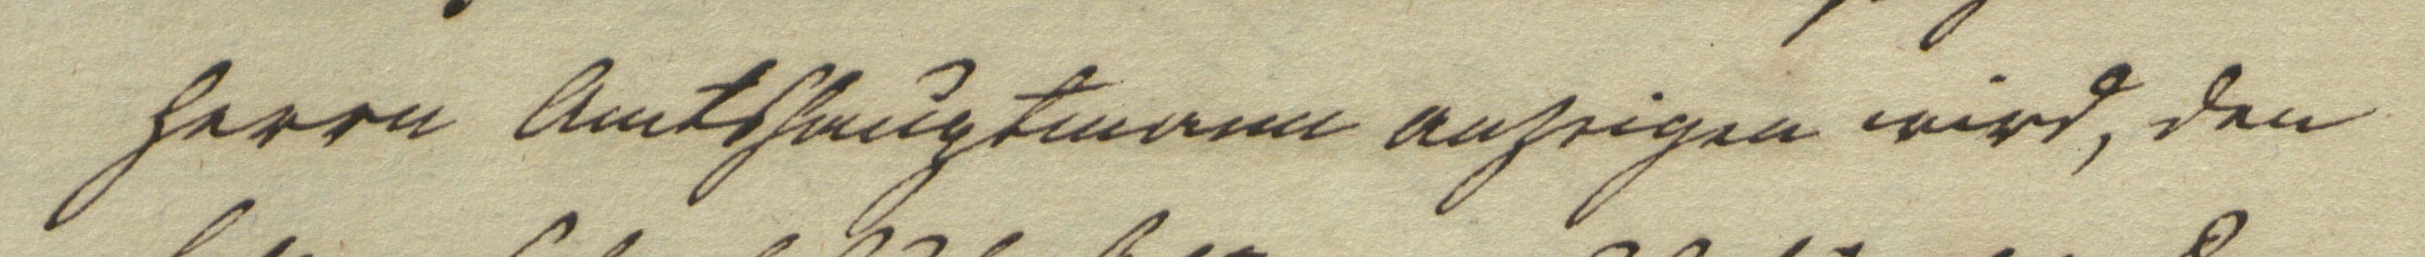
Herrn Amtshauptmann anzeigen wird, den
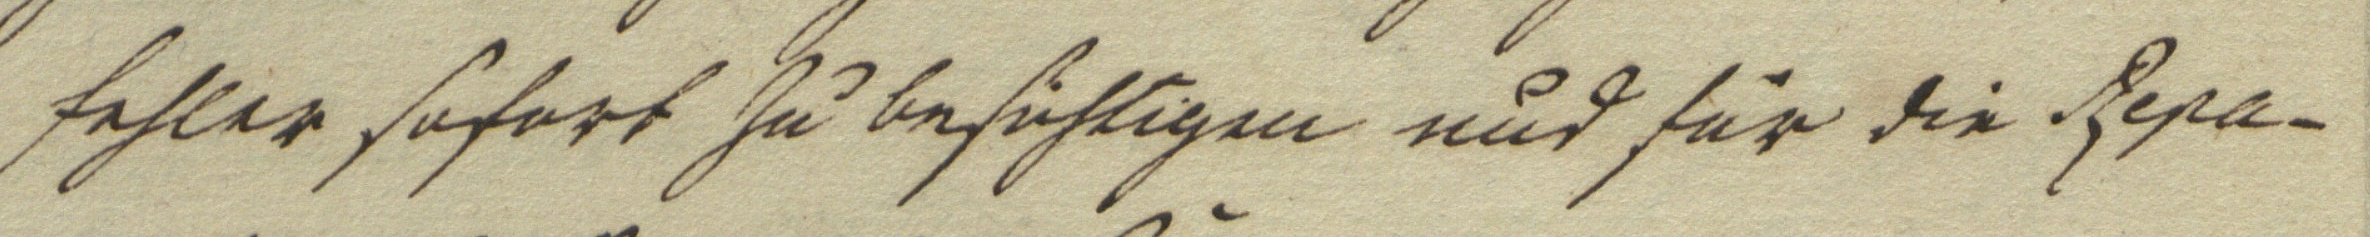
Fehler sofort zu besichtigen und für die Repa¬
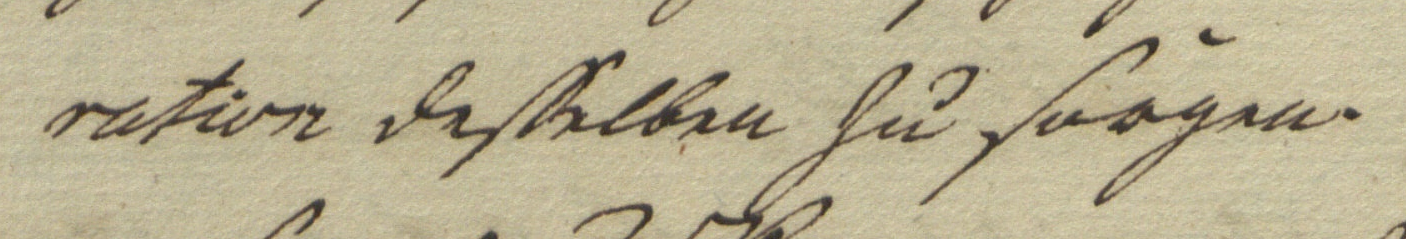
ration desselben zu sorgen.
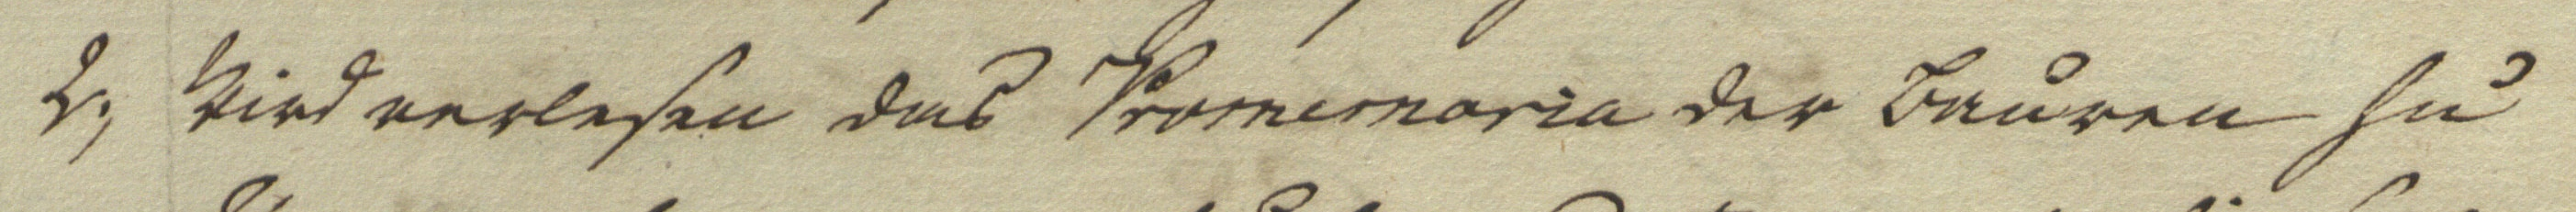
2., Wird verlesen das Promemoria der Bauren zu
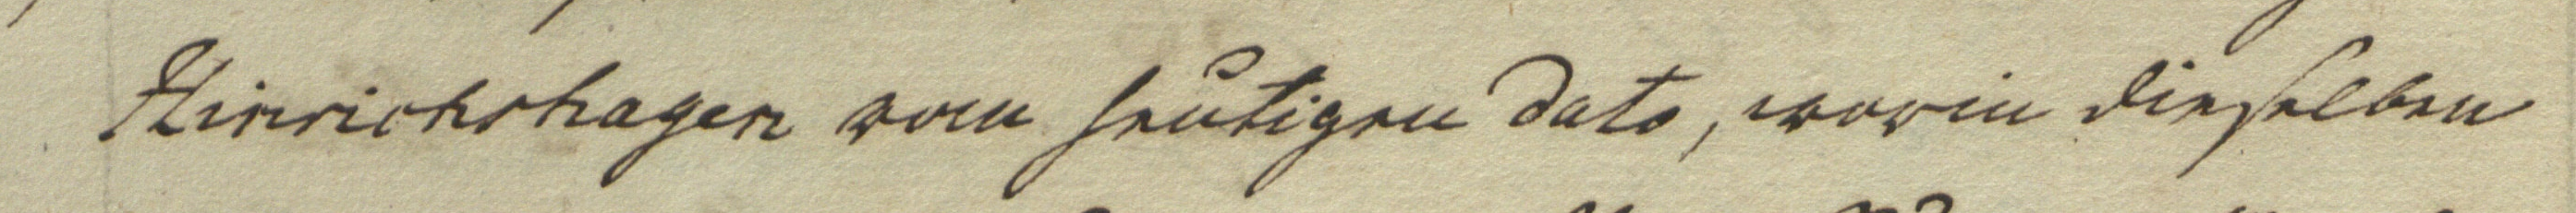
Hinrichshagen vom heutigen dato, worin dieselben
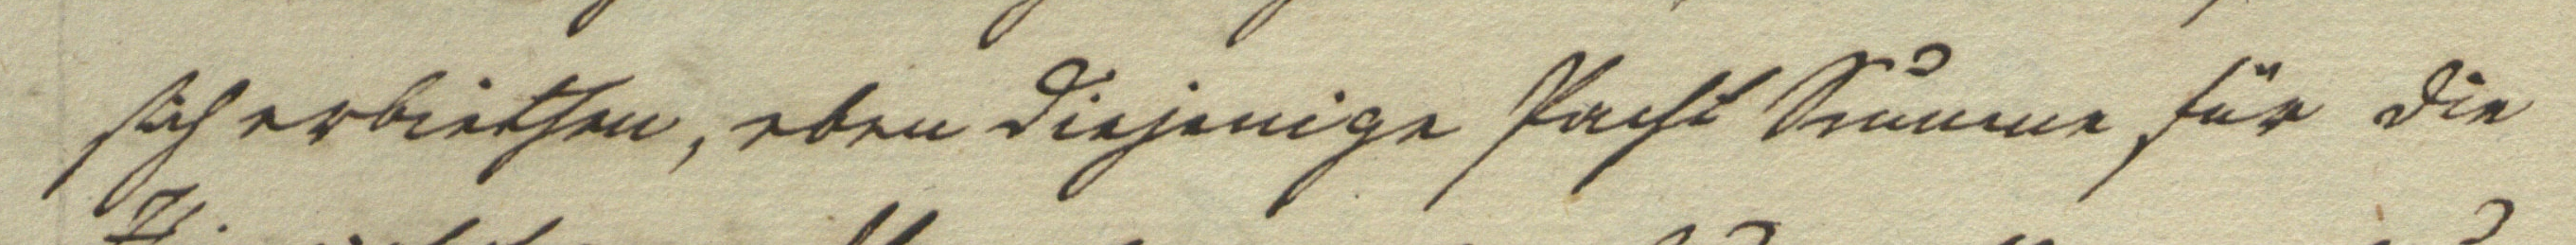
sich erbiethen, eben diejenige Pacht Summe für die
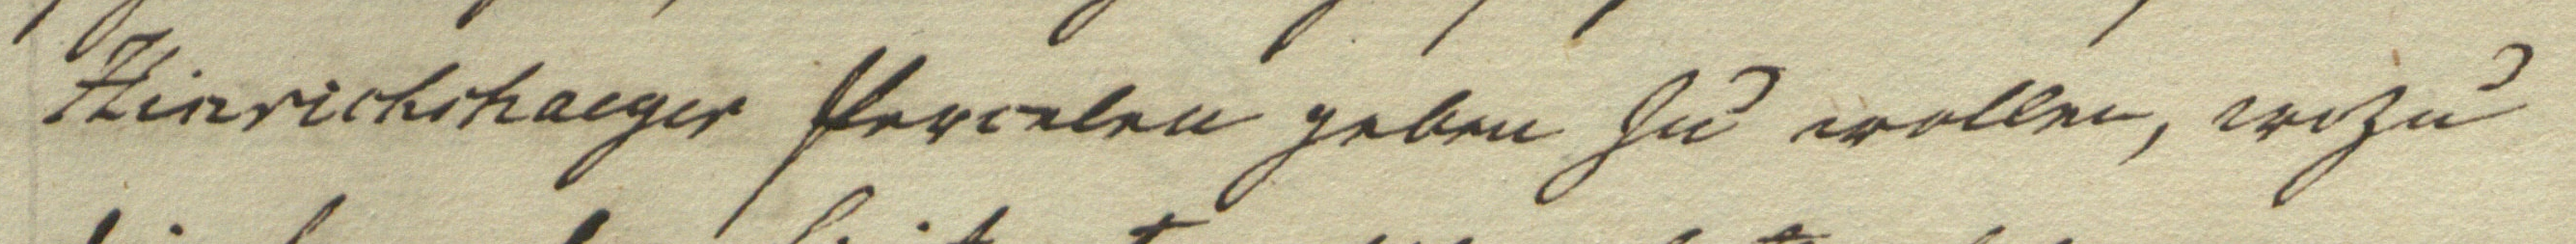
Hinrichshaeger Percelen geben zu wollen, wozu
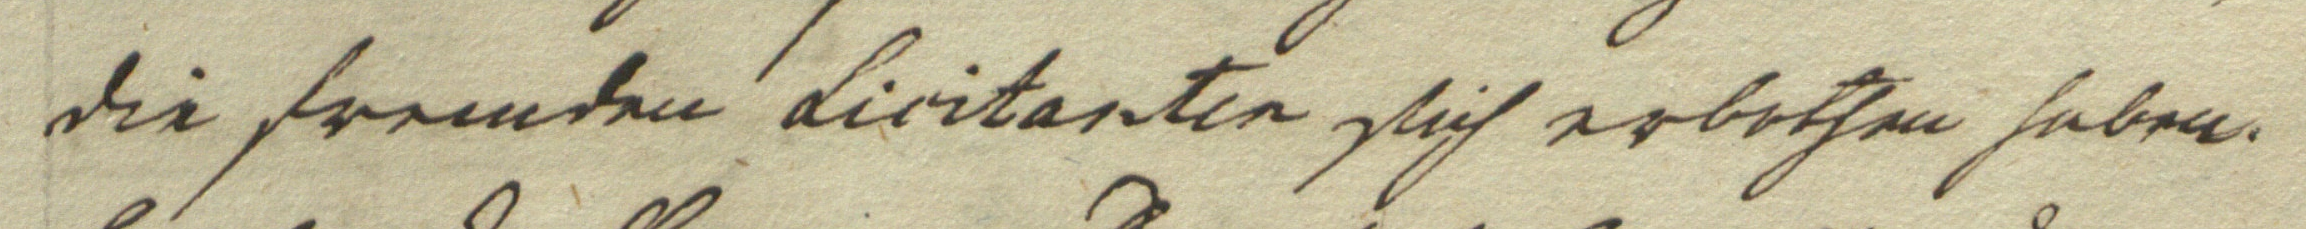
die fremden Licitanten sich erbothen haben.
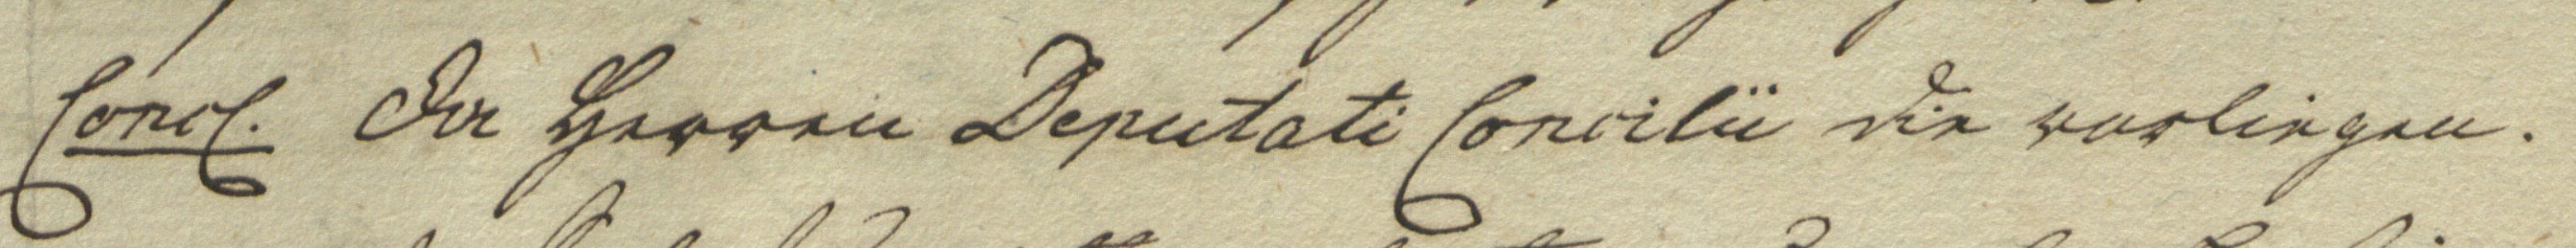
Concl. Da Herren Deputati Concilii die vorliegen¬
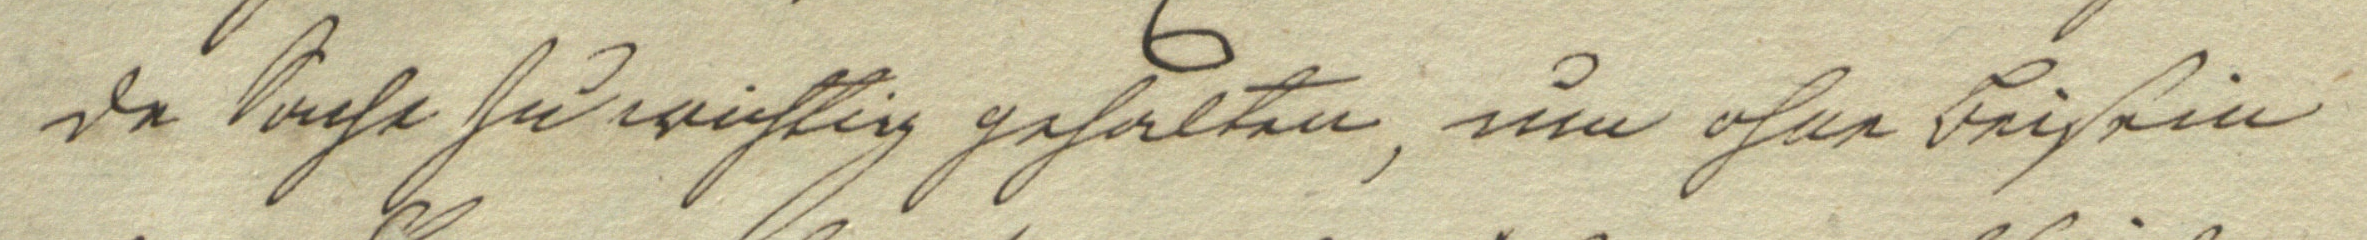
de Sache zu wichtig gehalten, um ohne Beisein
